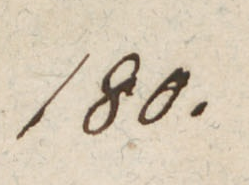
180.
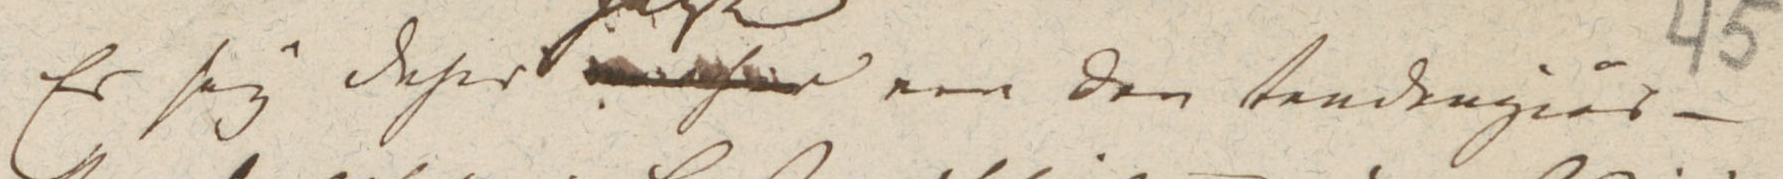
Es sey daher vorher jetzt von den tendenziös-
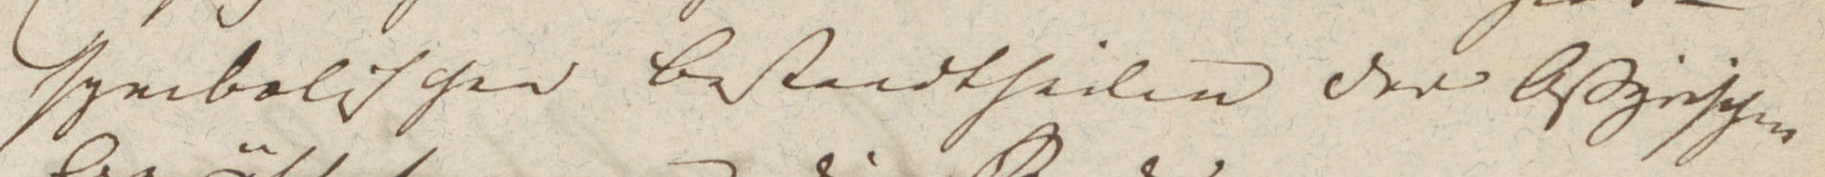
symbolischen Bestandtheilen der Assyrischen
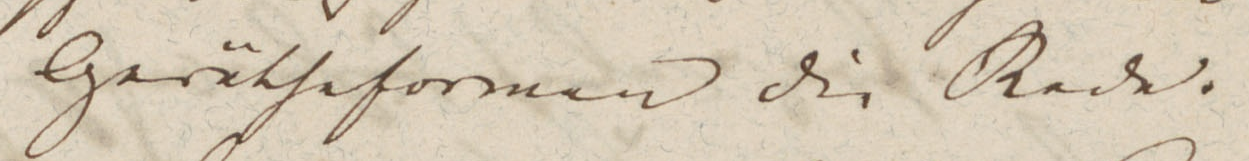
Gerätheformen die Rede.
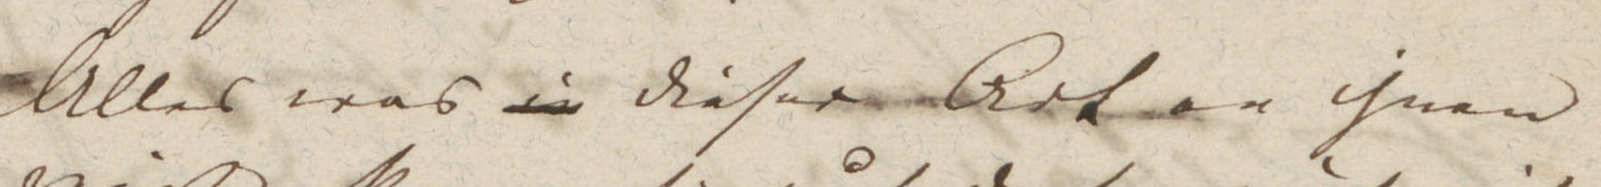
Alles was in dieser Art an ihnen
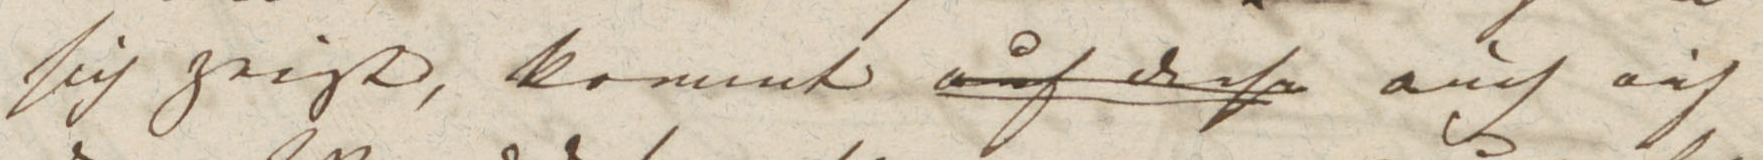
sich zeigt, kommt auf diese auch auf
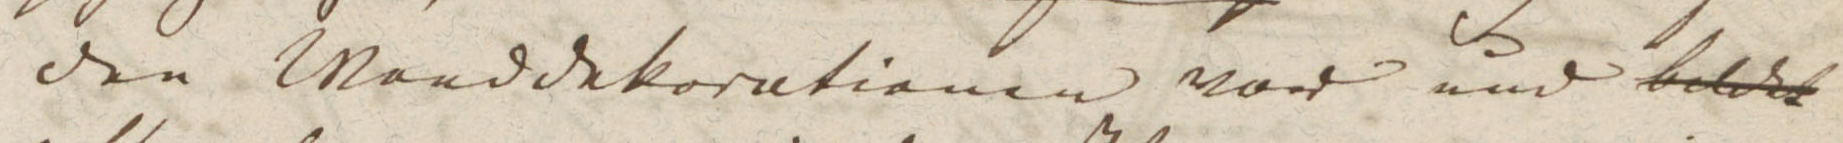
den Wanddekorationen vor und bildet
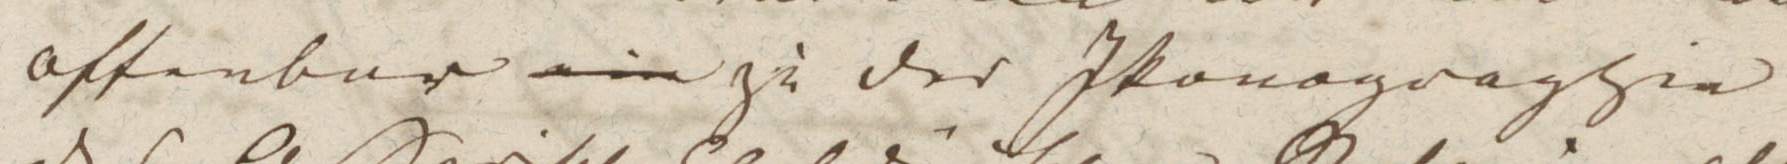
offenbar ein zu der Ikonographie
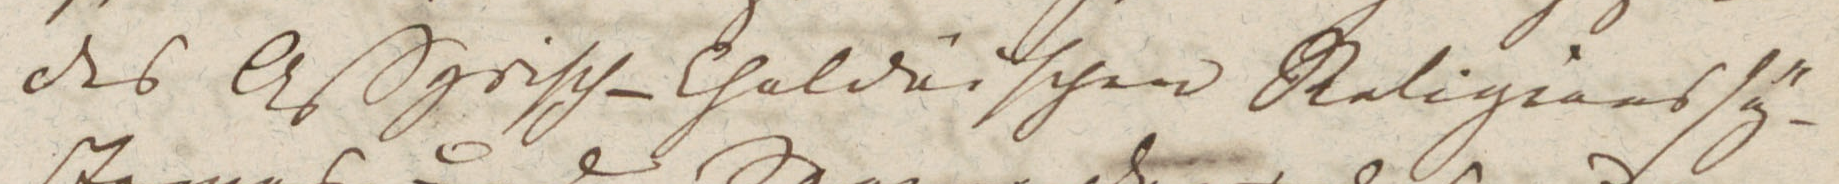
des Assyrisch-Chaldäischen Religionssy-
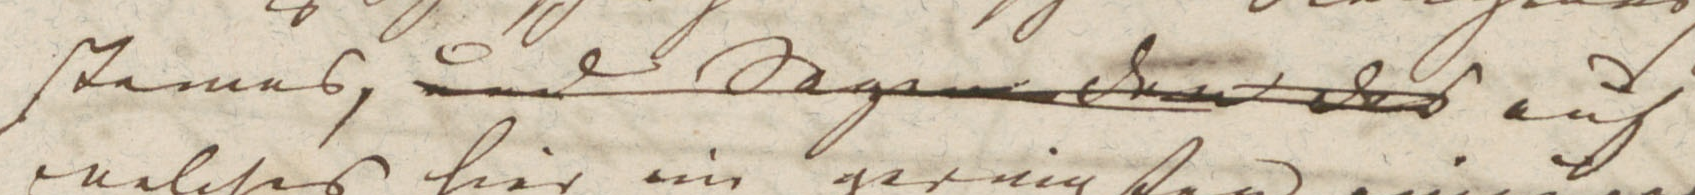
stemes, und Sagen den das auf
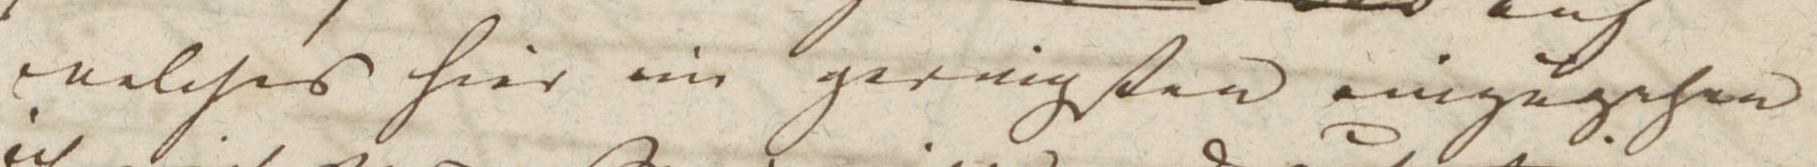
welches hier im geringsten einzugehen
